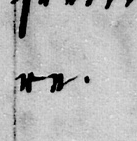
e,
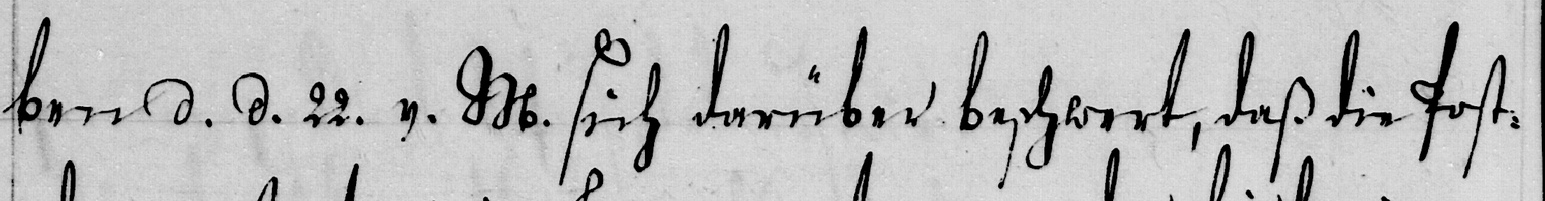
ben d. d. 22. v. M. sich darüber beschwert, daß die Post¬
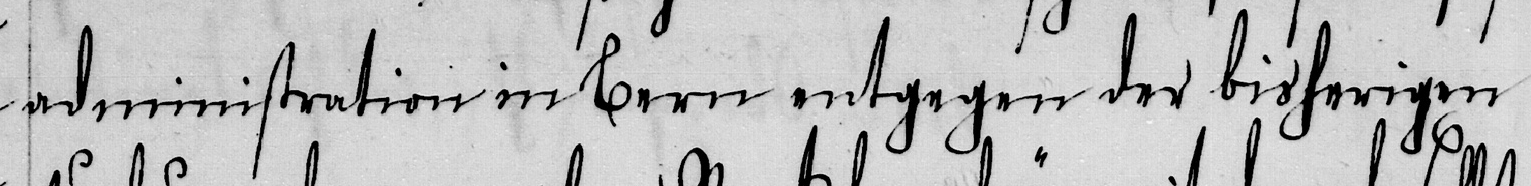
administration in Bern entgegen der bisherigen
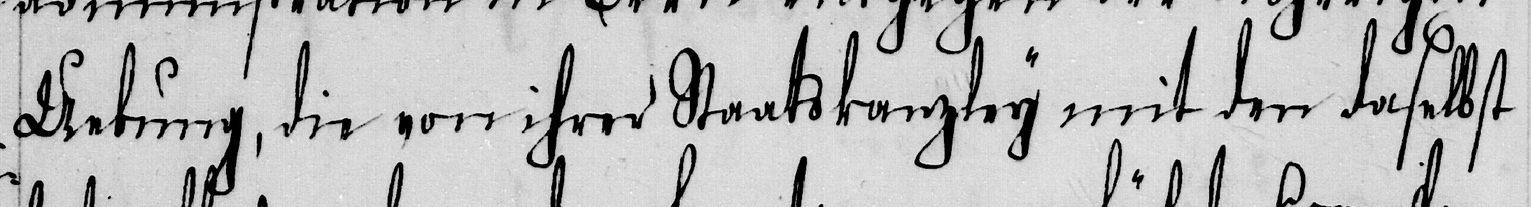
Uebung, die von ihrer Staatskanzley mit den daselbst
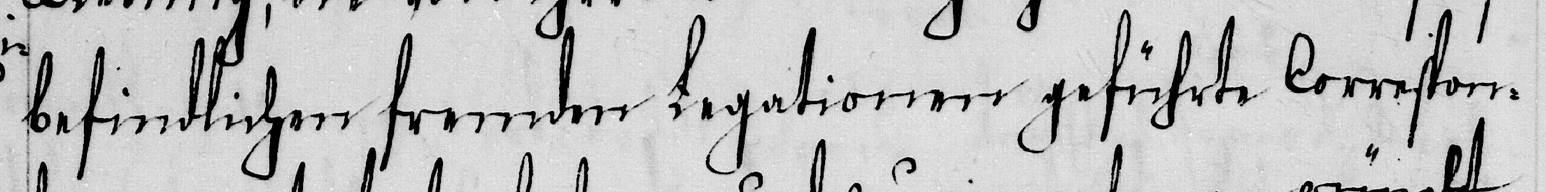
befindlichen fremden Legationen geführte Correspon¬
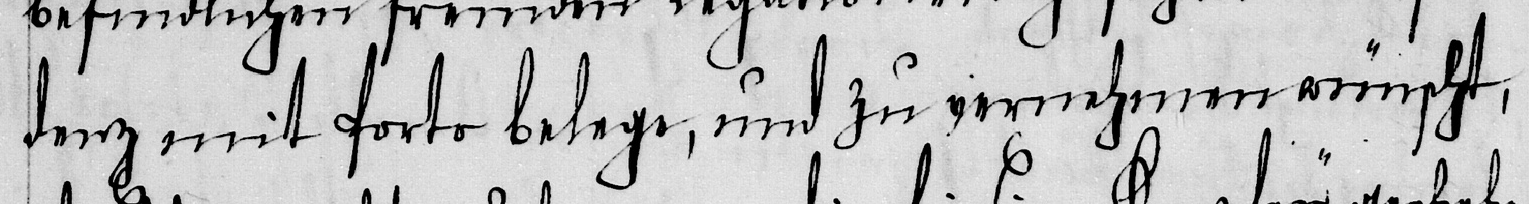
denz mit Porto belege, und zu vernehmen wünscht,
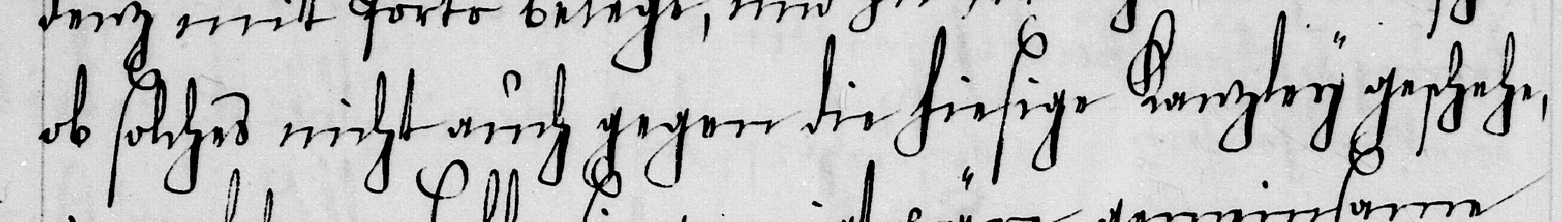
ob solches nicht auch gegen die hiesige Kanzley gescheh¬
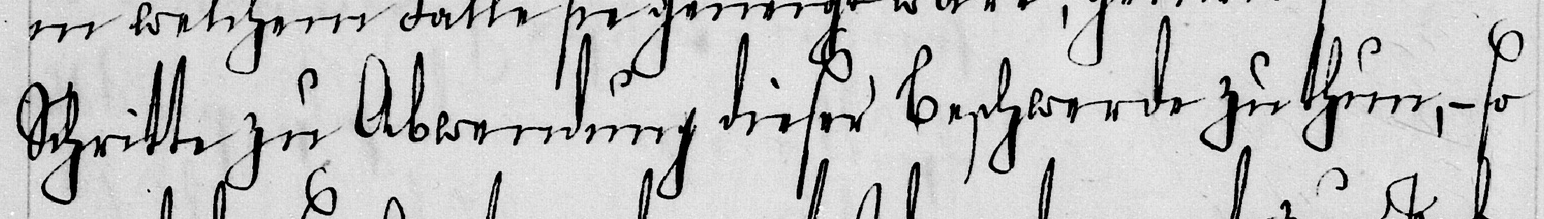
Schritte zu Abwendung dieser Beschwerde zu thun, –
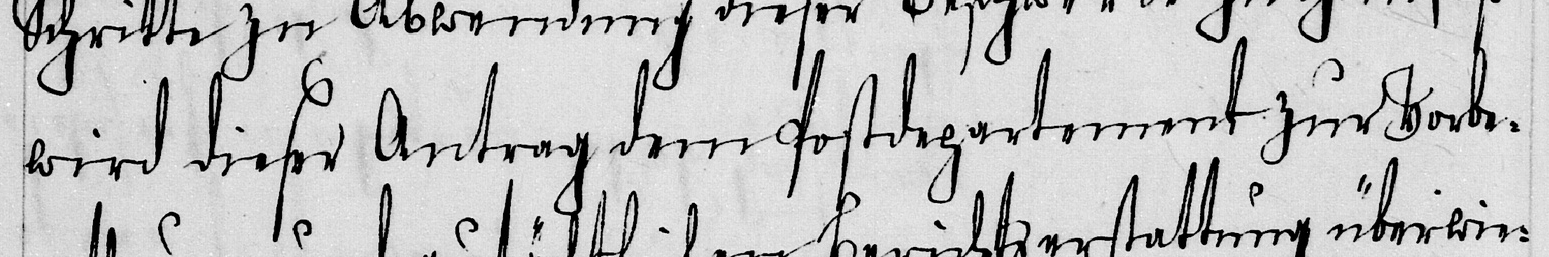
wird dieser Antrag dem Postdepartement zur Vorbe¬
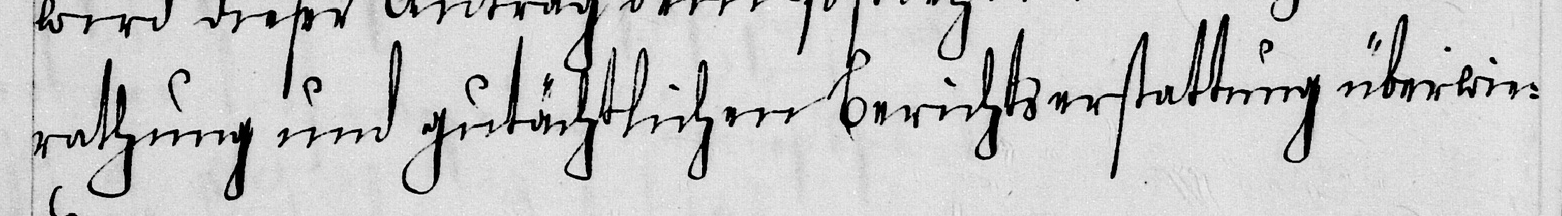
rathung und gutächtlichen Berichtserstattung überwie¬
